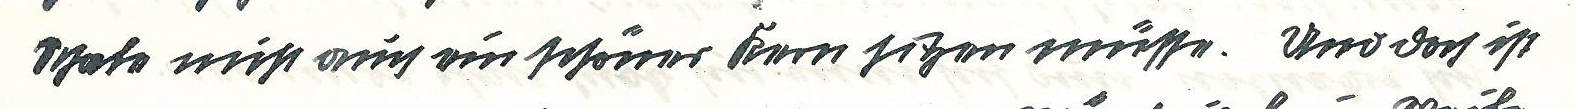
Schale nicht auch ein schöner Kern sitzen müsse. Und doch ist
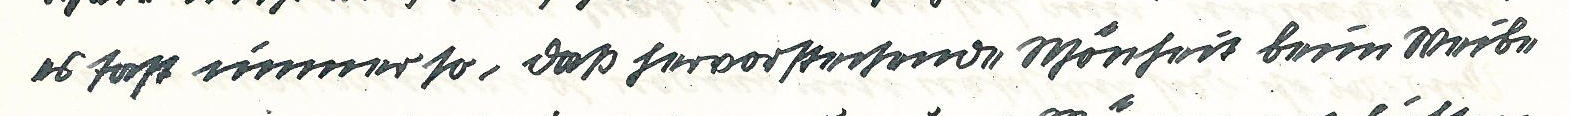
es fast immer so, daß hervorstechende Schönheit beim Weibe¬
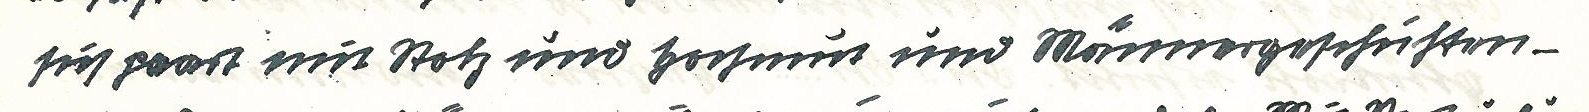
sich paart mit Stolz und Hochmut und Männergeschichten –
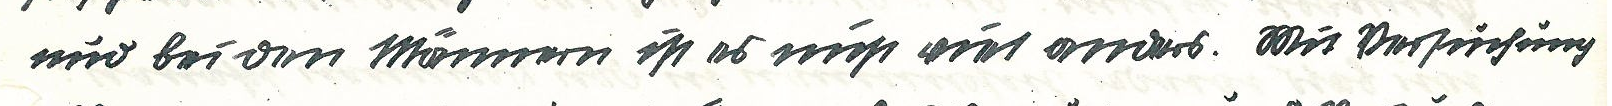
und bei den Männern ist es nicht viel anders. Mit Versuchung
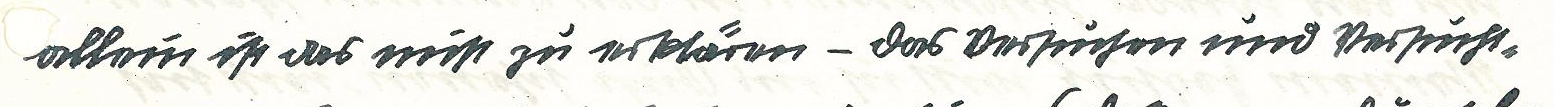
allein ist das nicht zu erklären – das Versuchen und Versucht¬
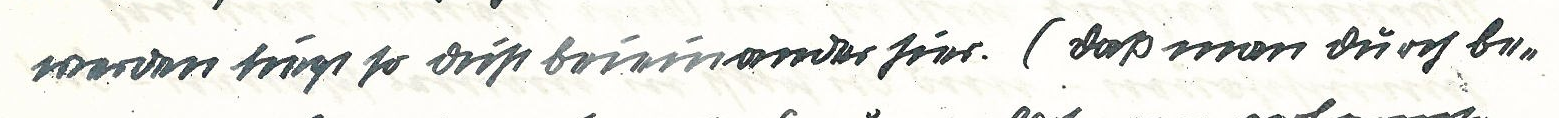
werden liegt so dicht beieinander hier. (Daß man durch be¬
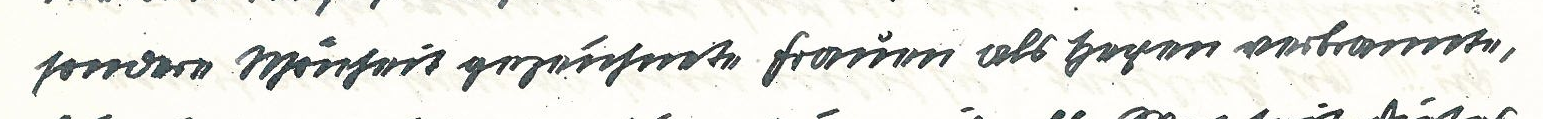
sondere Schönheit gezeichnete Frauen als Hexen verbrannte,
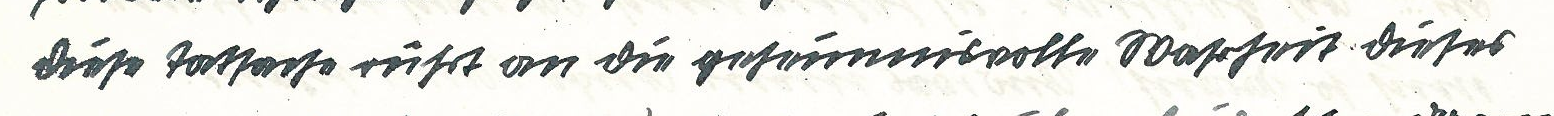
diese Tatsache rührt an die geheimnisvolle Wahrheit dieses
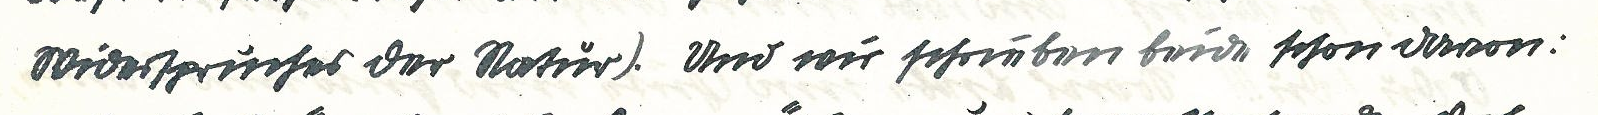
Widerspruches der Natur). Und wir schrieben beide schon davon:
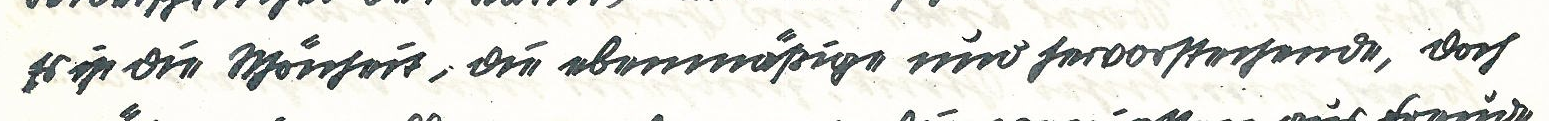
Es ist die Schönheit, die ebenmäßige und hervorstechende, doch
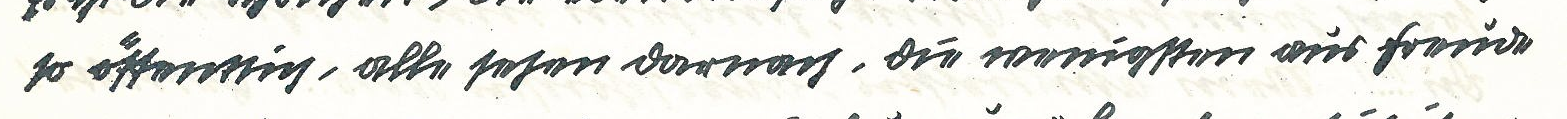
so öffentlich, alle sehen darnach, die wenigsten aus Freude
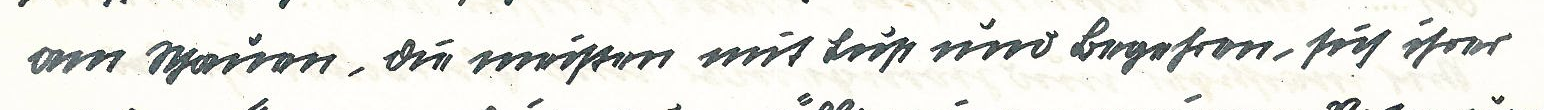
am Schauen, die meisten mit Lust und Begehren, sich ihrer
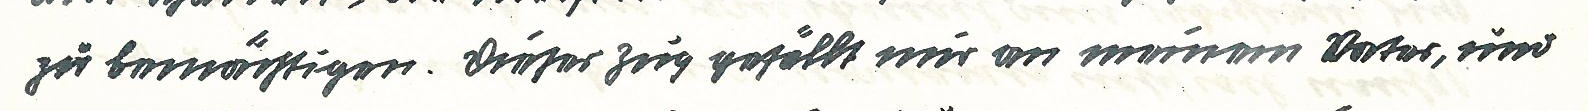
zu bemächtigen. Dieser Zug gefällt mir an meinem Vater, und
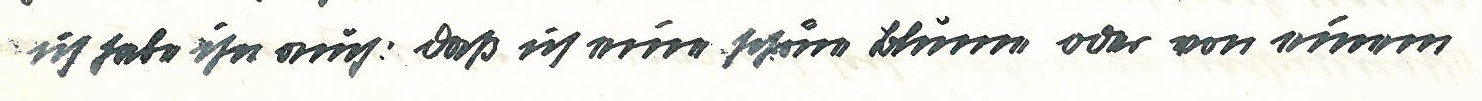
ich habe ihn auch: Daß ich eine schöne Blume oder von einem
